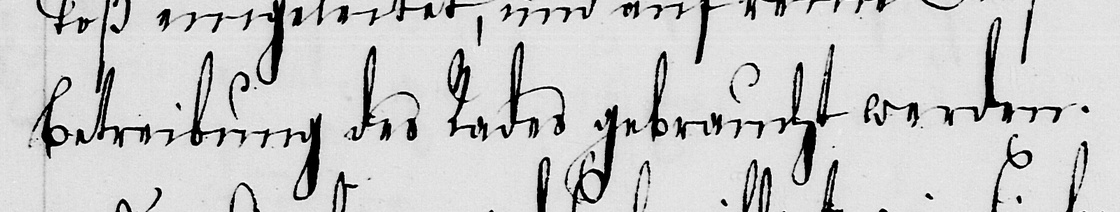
Betreibung des Rades gebraucht werden.
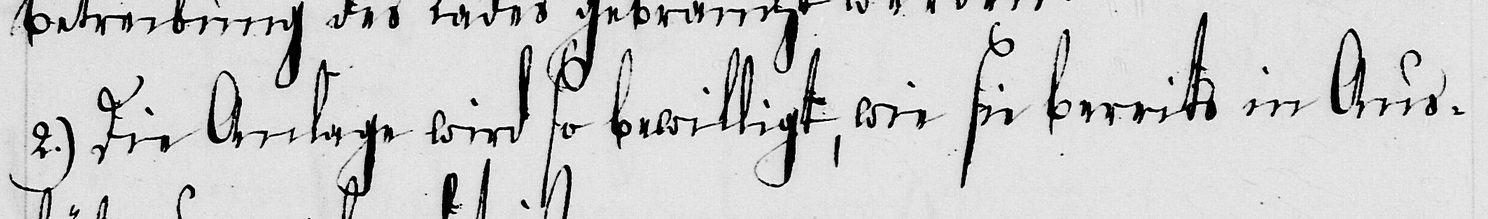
2.) Die Anlage wird so bewilligt, wie sie bereits in Aus¬
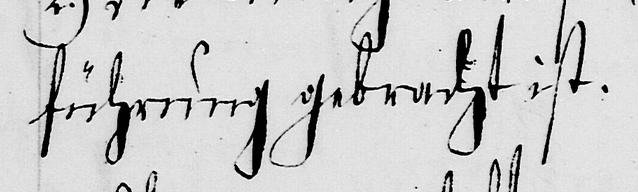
führung gebracht ist.
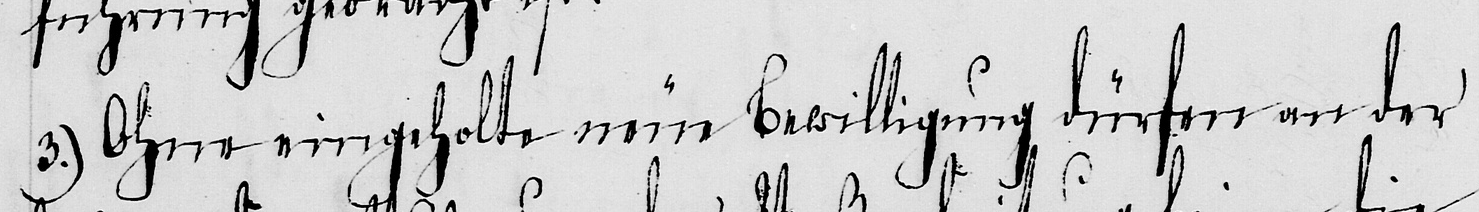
3.) Ohne eingeholte neue Bewilligung dürfen an der
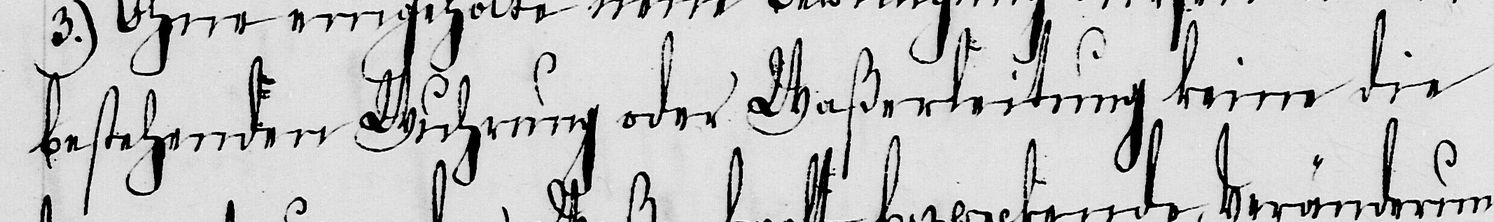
bestehenden Wuhrung oder Waßerleitung keine die
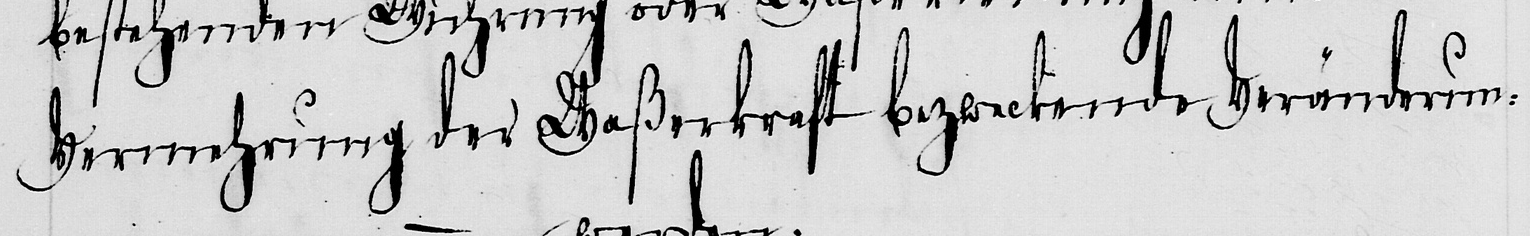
Vermehrung der Waßerkraft bezweckende Veränderun¬
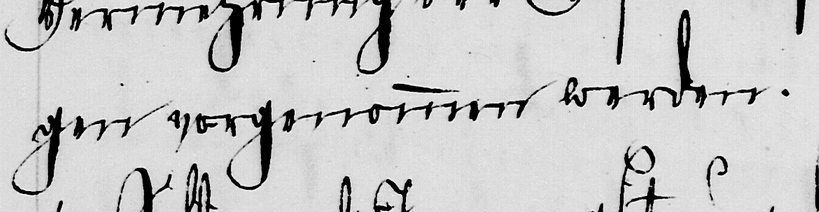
gen vorgenommen werden.
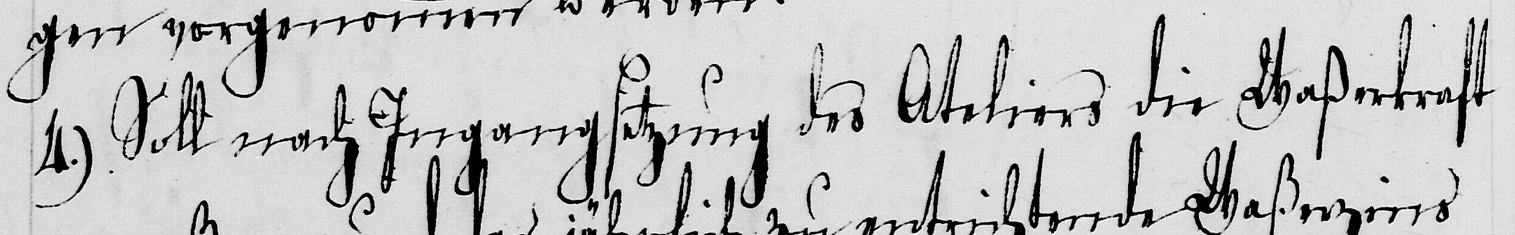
4.) Soll nach Ingangsetzung des Ateliers die Waßerkraft
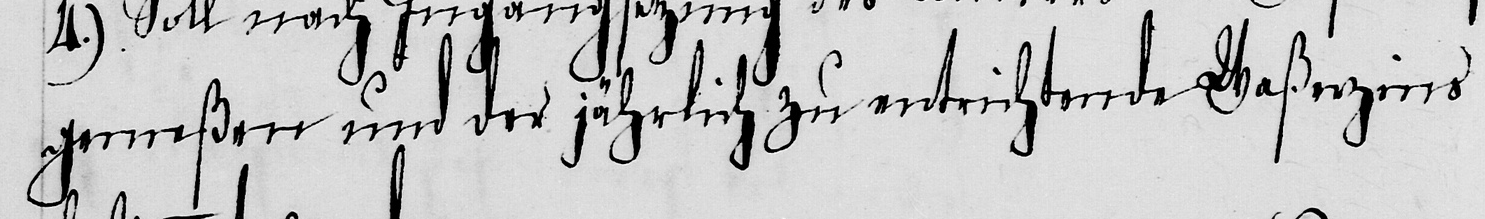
gemeßen und der jährlich zu entrichtende Waßerzins
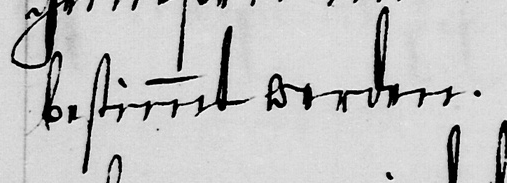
bestimmt werden.
